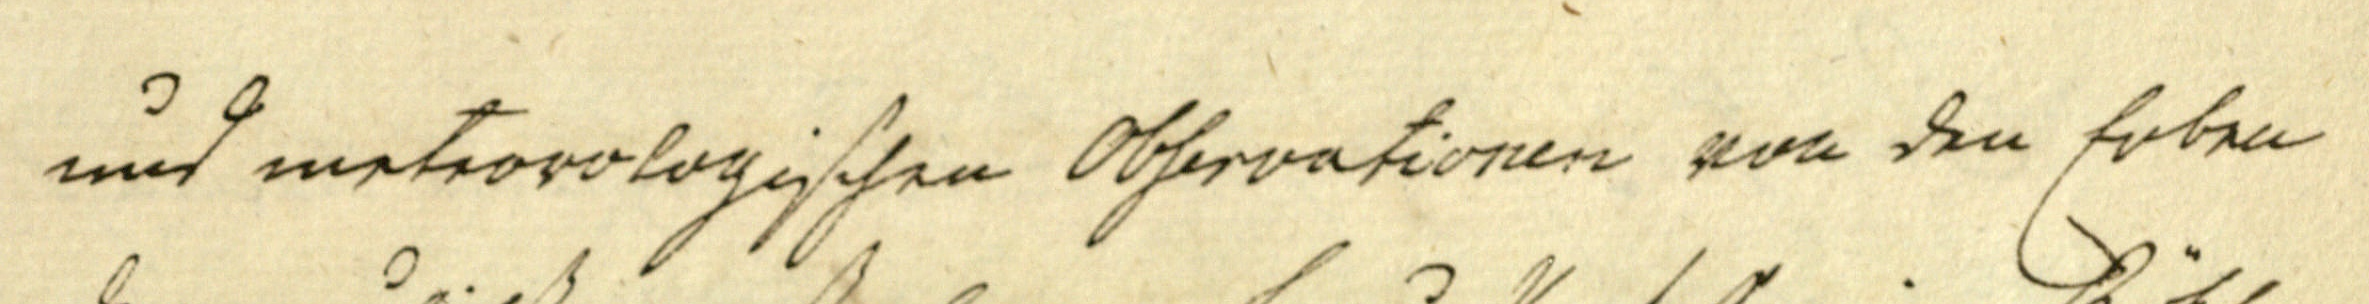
und meteorologischen Observationen von den Erben
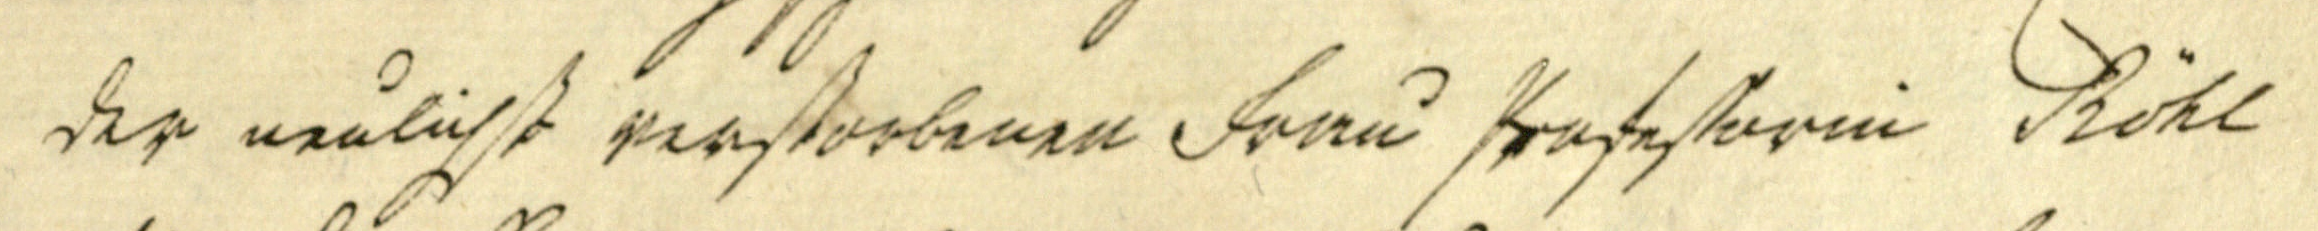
der neulichst verstorbenen Frau Professorin Röhl
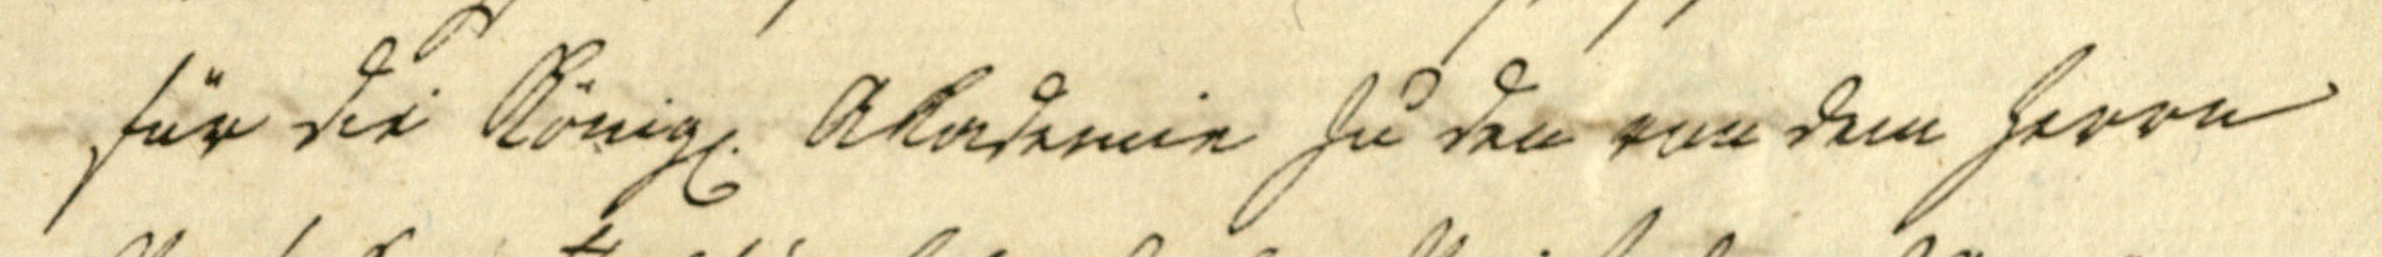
für die Königl. Akademie zu den von dem Herrn
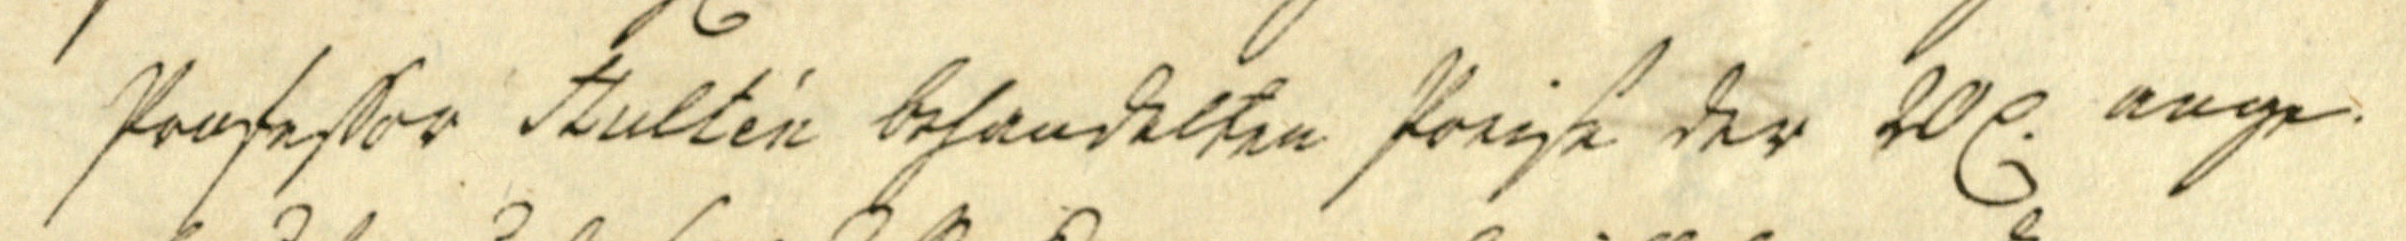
Professor Hultén behandelten Preise der 20 l. ange¬
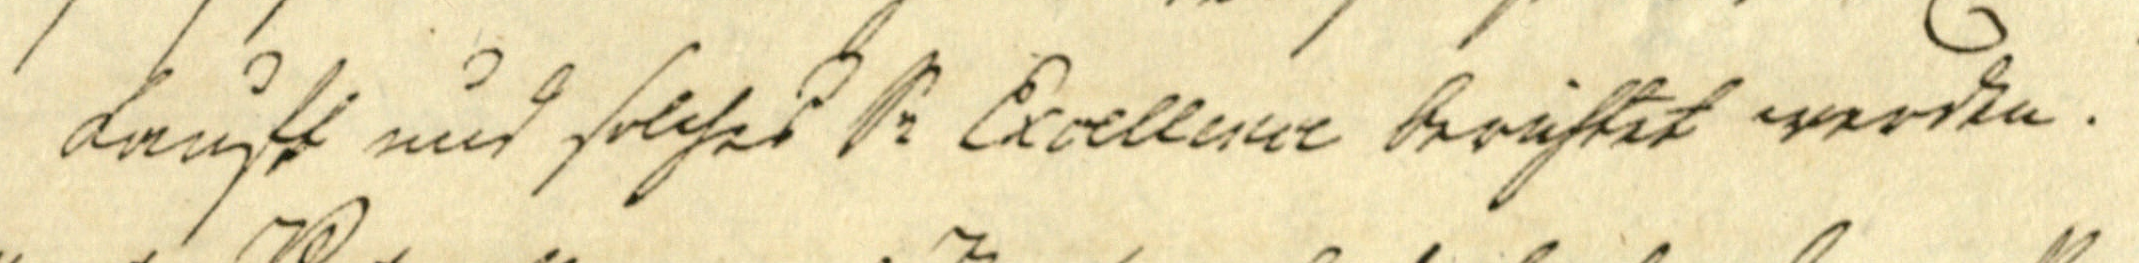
kauft und solches Sr Excellence berichtet werden.
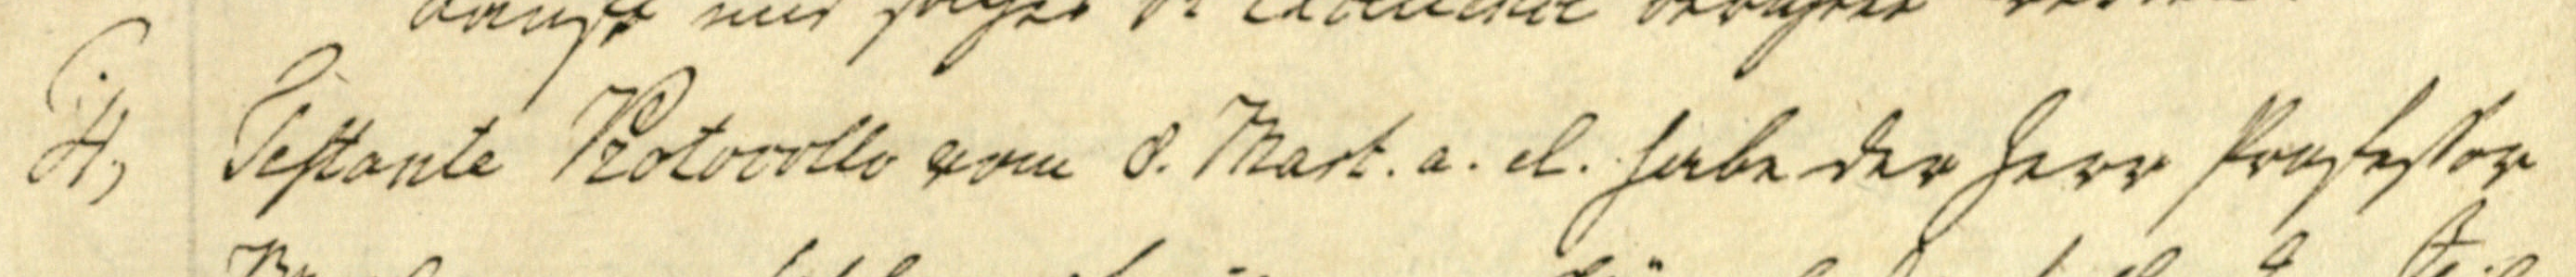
4, Testante Protocollo vom 8 Mart. a. el. habe der Herr Professor
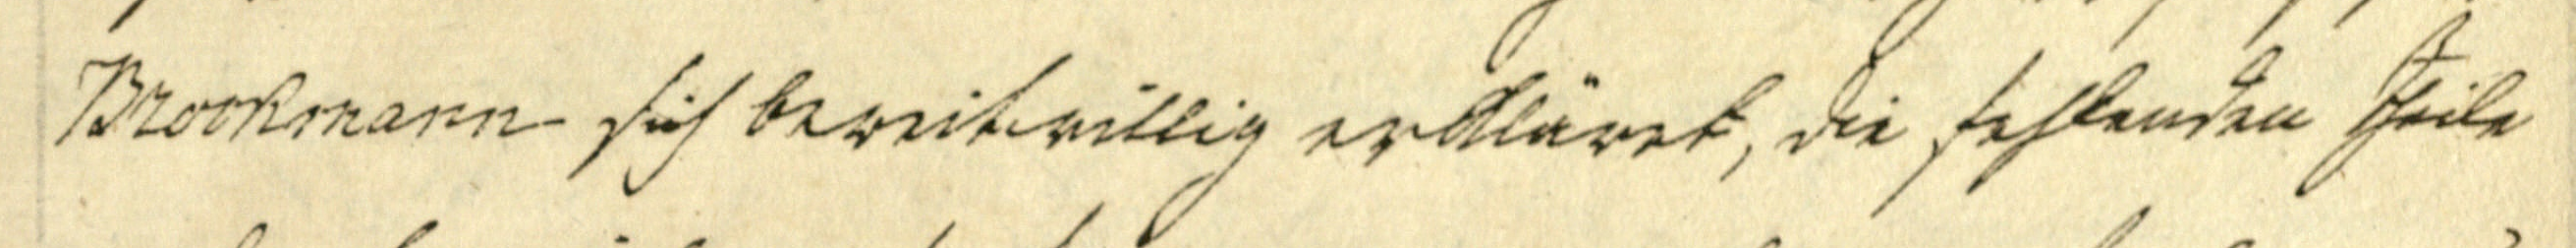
Brockmann sich bereitwillig erkläret, die fehlenden Theile
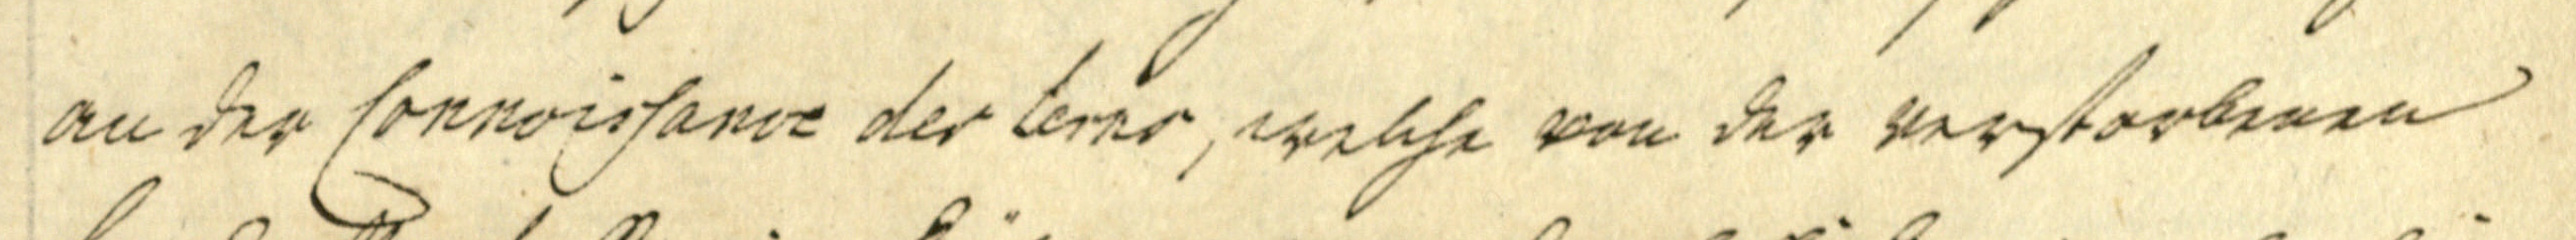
an der Connaissance des terns, welche von der verstorbenen
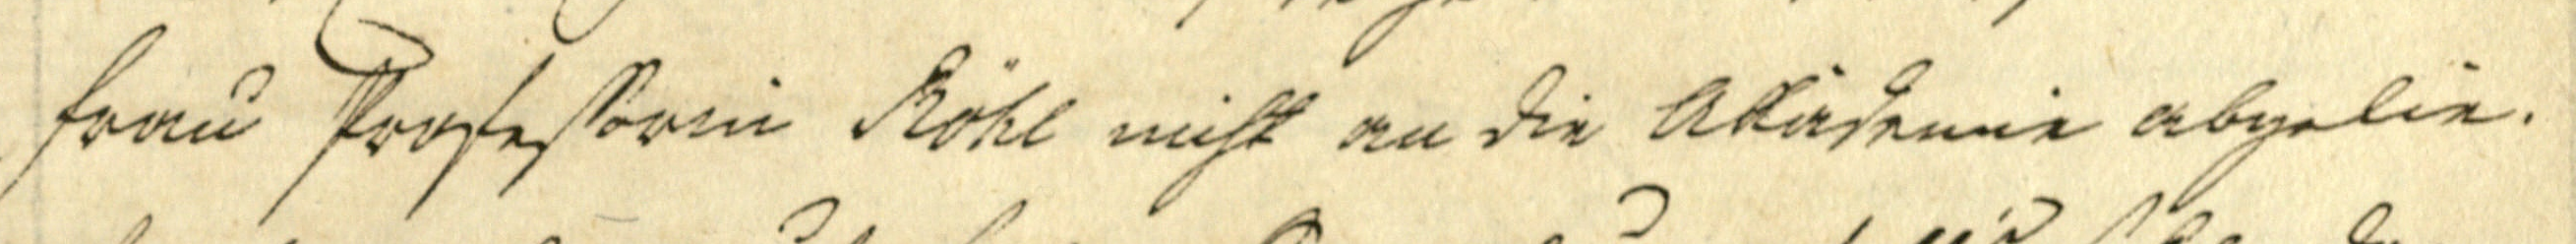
Frau Professorin Röhl nicht an die Akademie abgelie¬
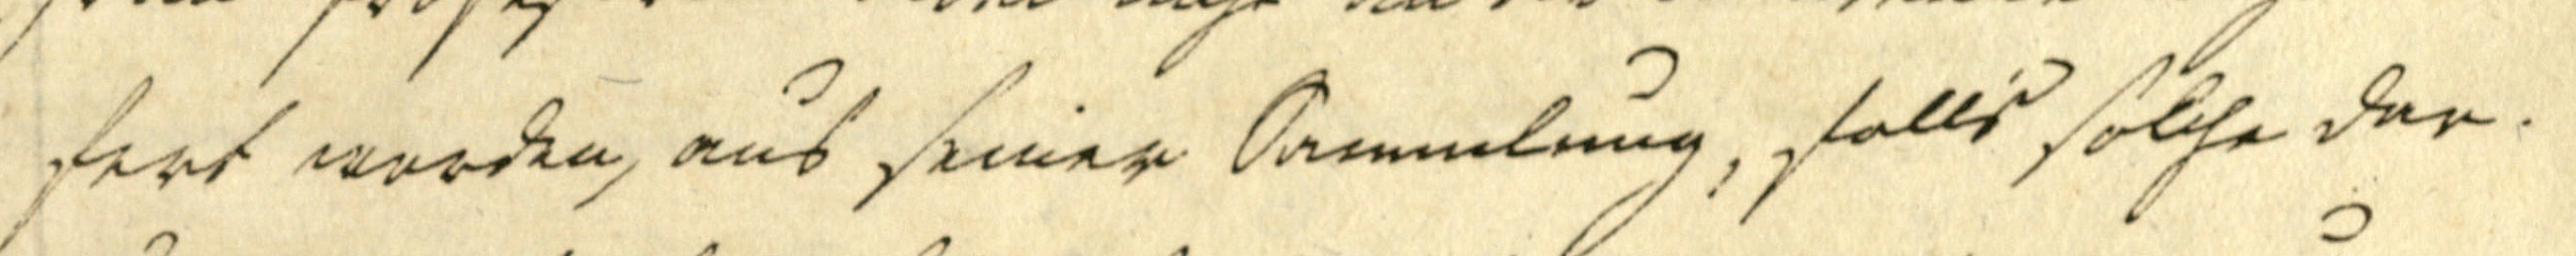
fert worden, aus seiner Sammlung, falls solche dar¬
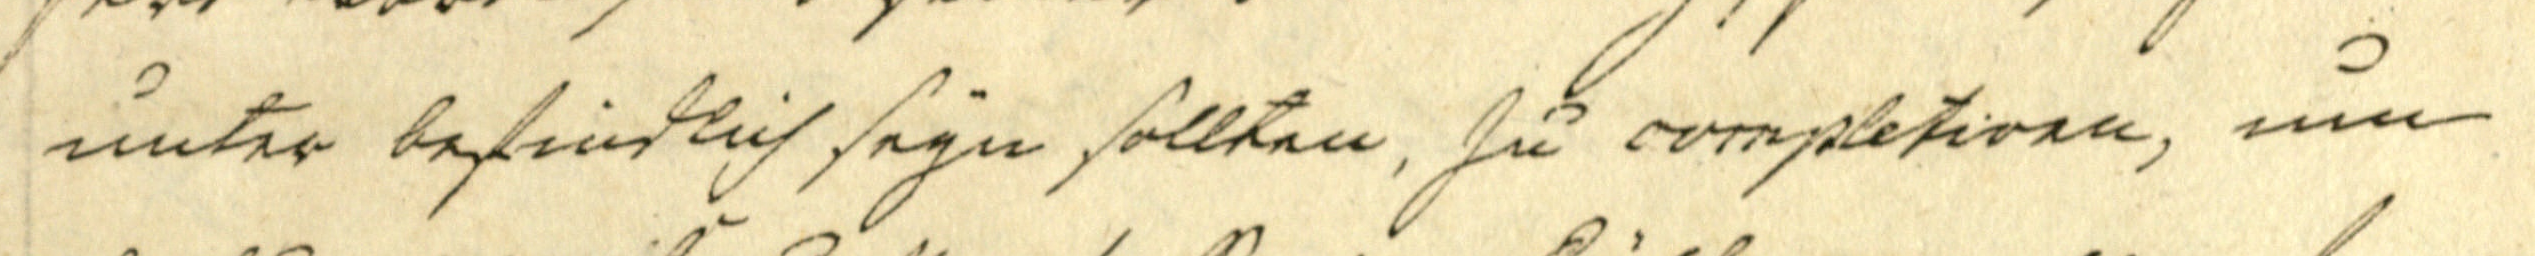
unter befindlich seÿn sollten, zu completiren, um
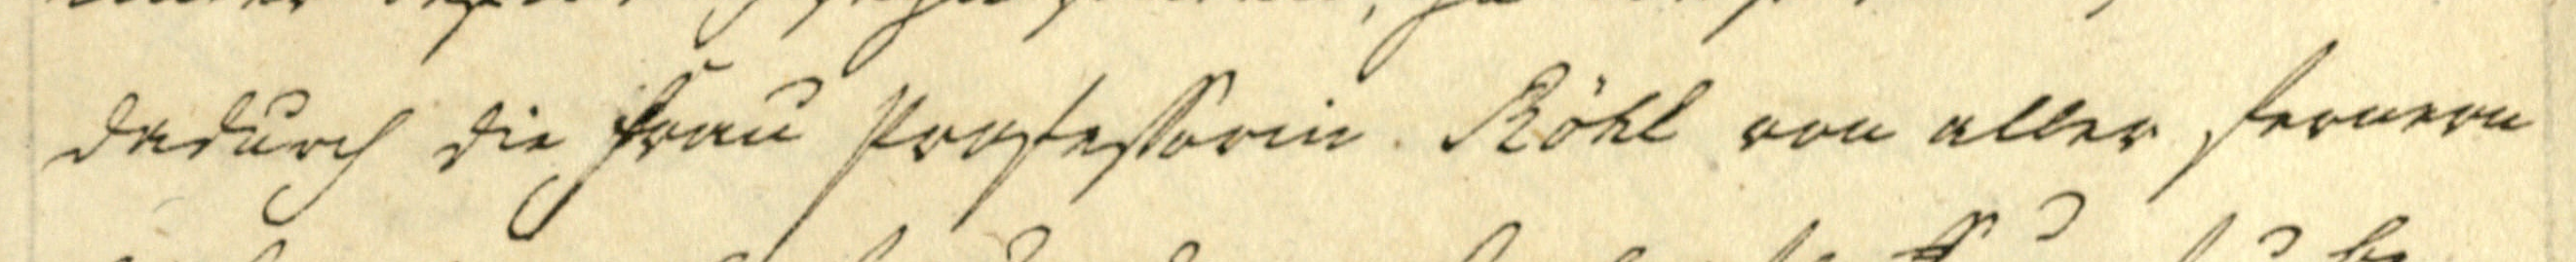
dadurch die Frau Professorin Röhl von aller fernere
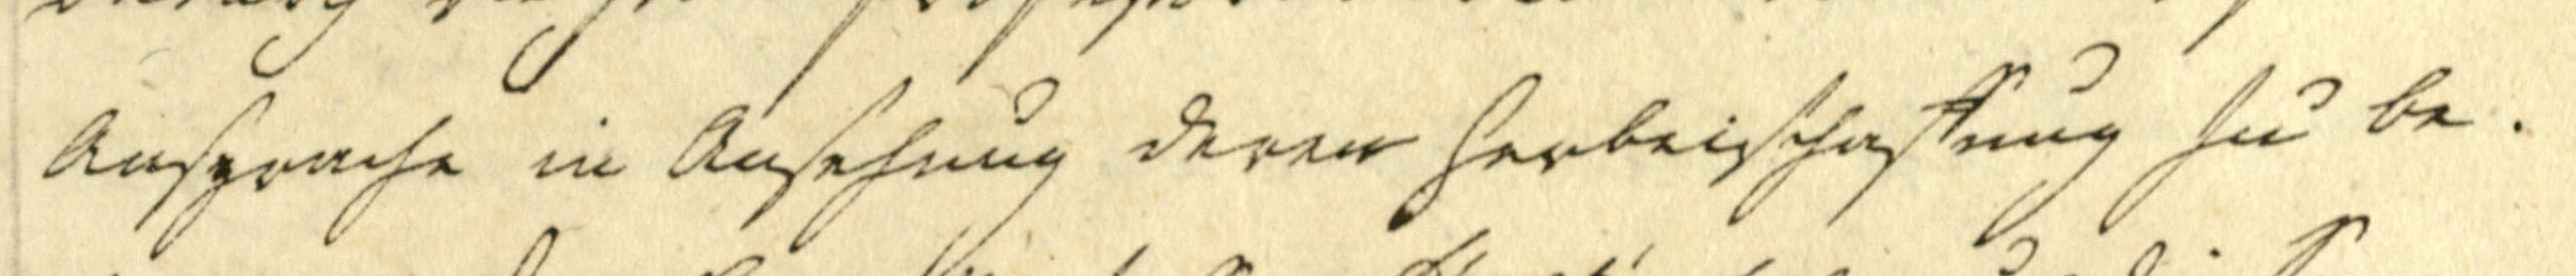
Ansprache in Ansehung deren Herbeischaffung zu be¬
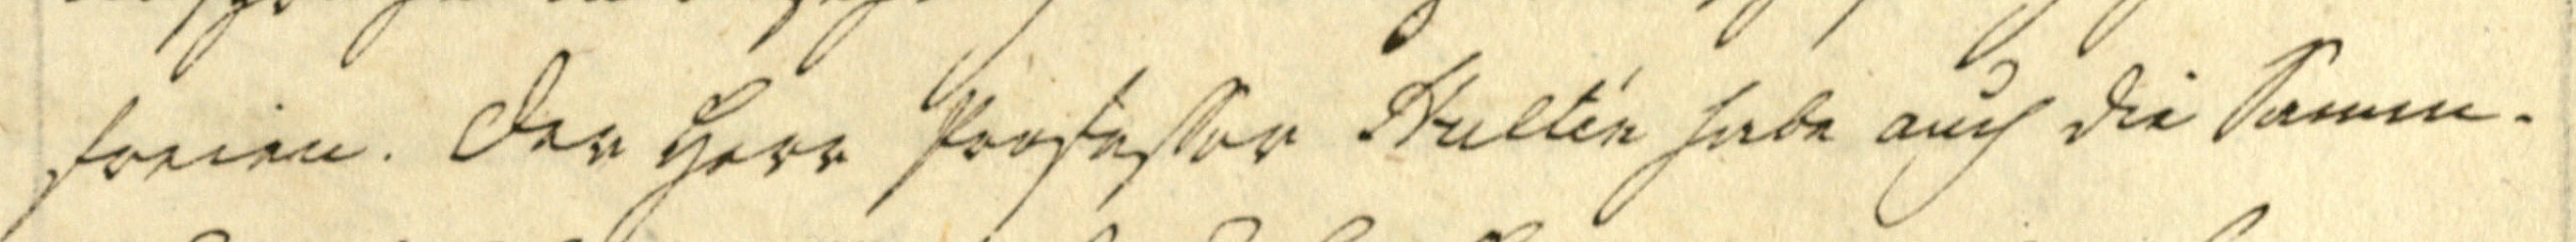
freien. Der Herr Professor Hultén habe auch die Samm¬
